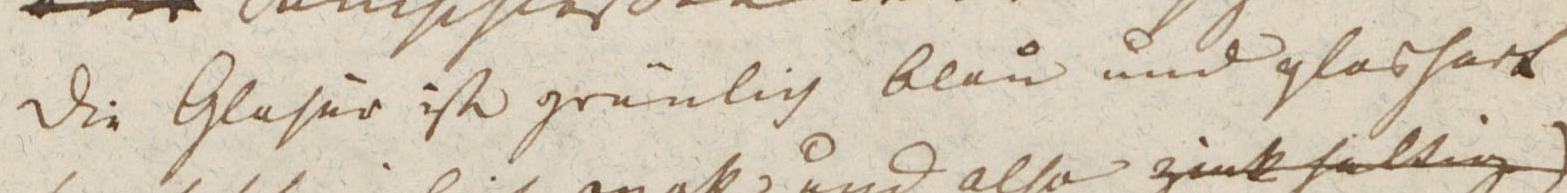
Die Glasur ist grünlich blau und glashart
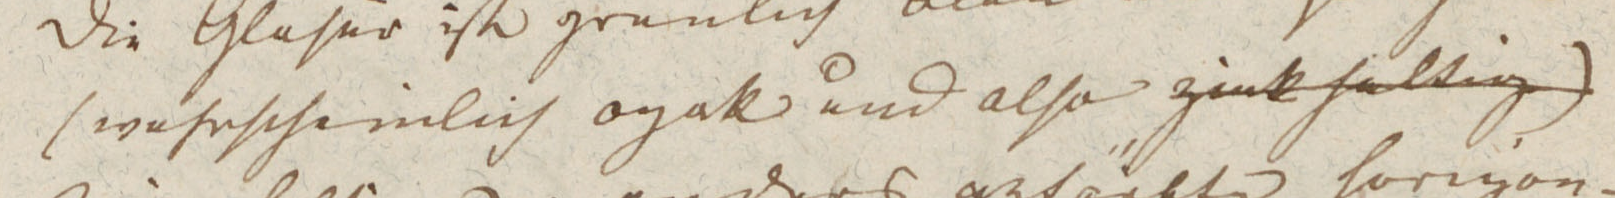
(wahrscheinlich opak und also zink haltig)
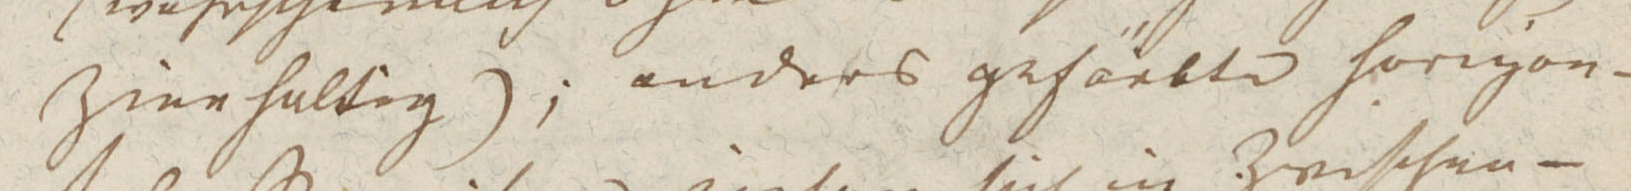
Zinnhaltig); anders gefärbte horizon-
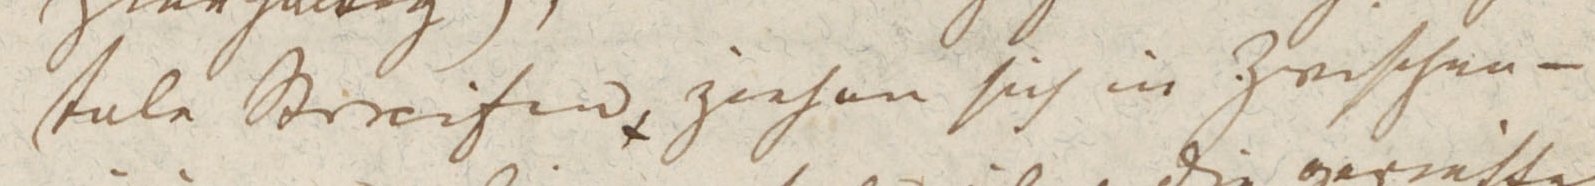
tale Streifen, ziehen sich in Zwischen-
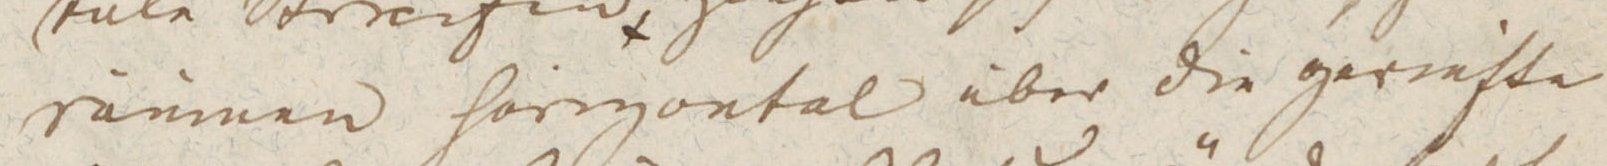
räumen horizontal über die geriefte
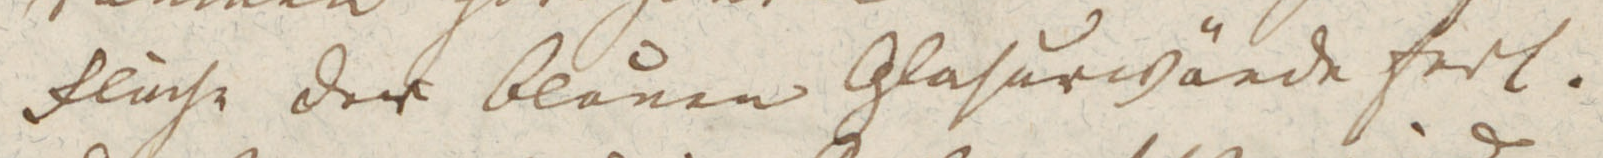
Fläche der blauen Glasurwände fort.
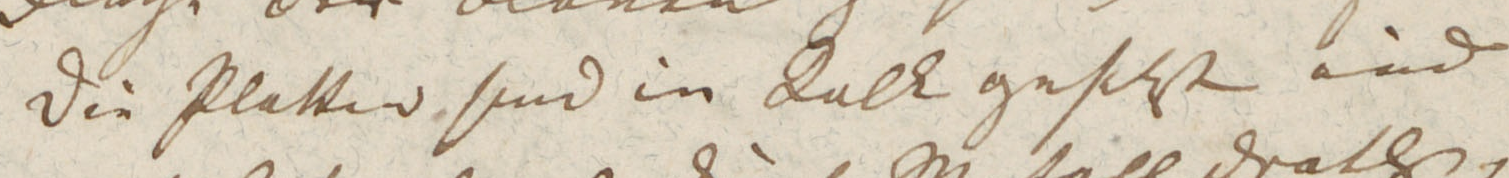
Die Platten sind in Kalk gesetzt und
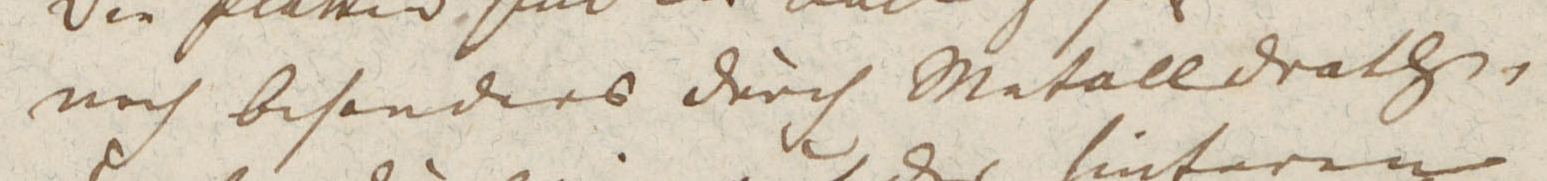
noch besonders durch Metalldrath,
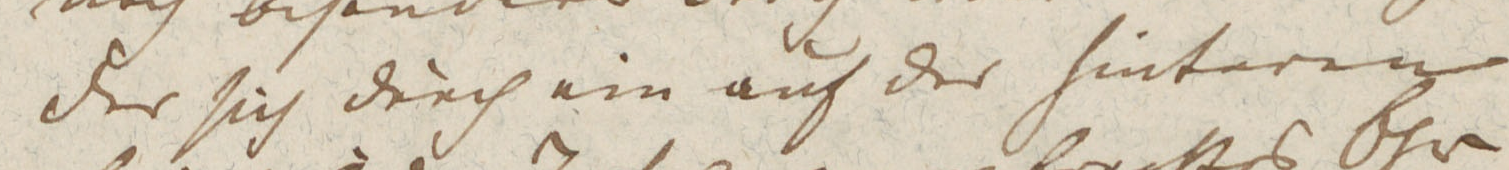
der sich durch ein auf der hinteren
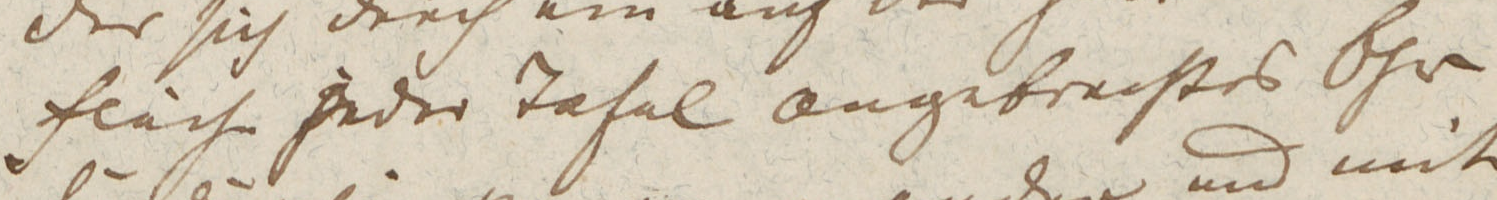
Fläche jeder Tafel angebrachtes Ohr
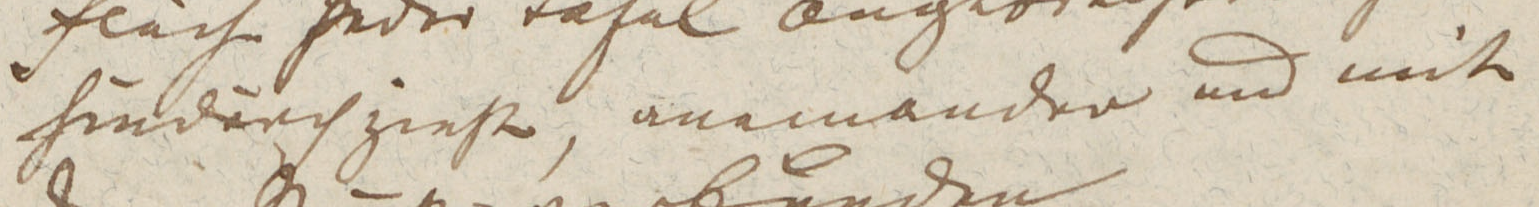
hindurch zieht, aneinander und mit
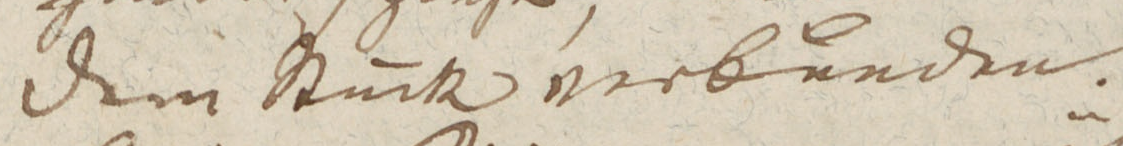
dem Stück verbunden.
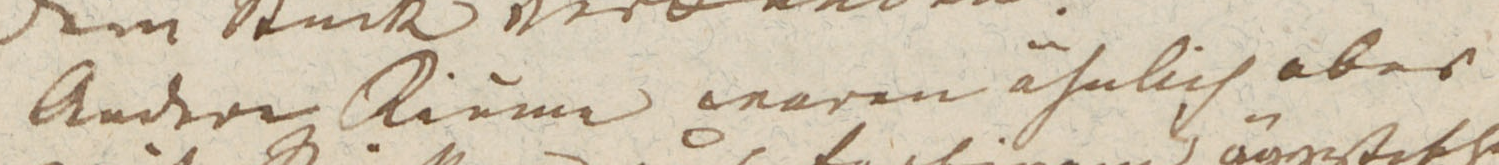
Andere Räume waren ähnlich aber
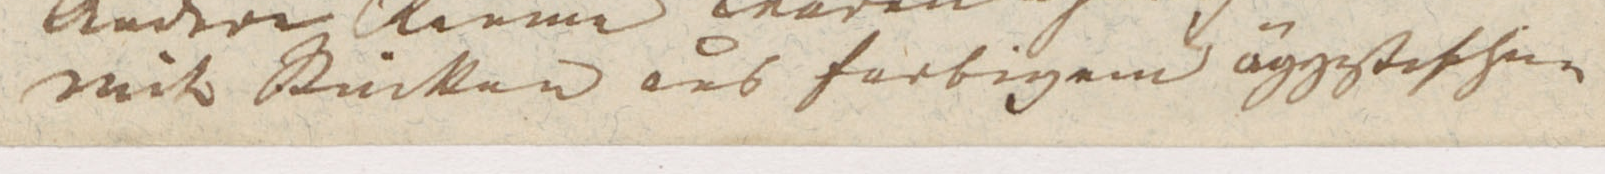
mit Sticken aus farbigem ägyptischem
